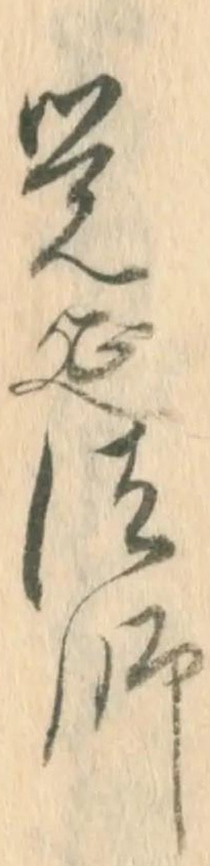覚延法師
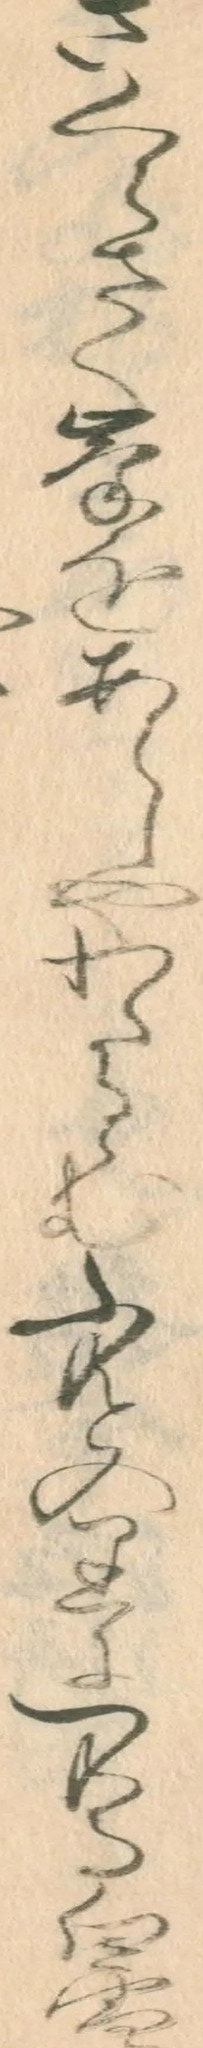さくらさく峯をあらしやわたるらむふもとの里につもる白雪
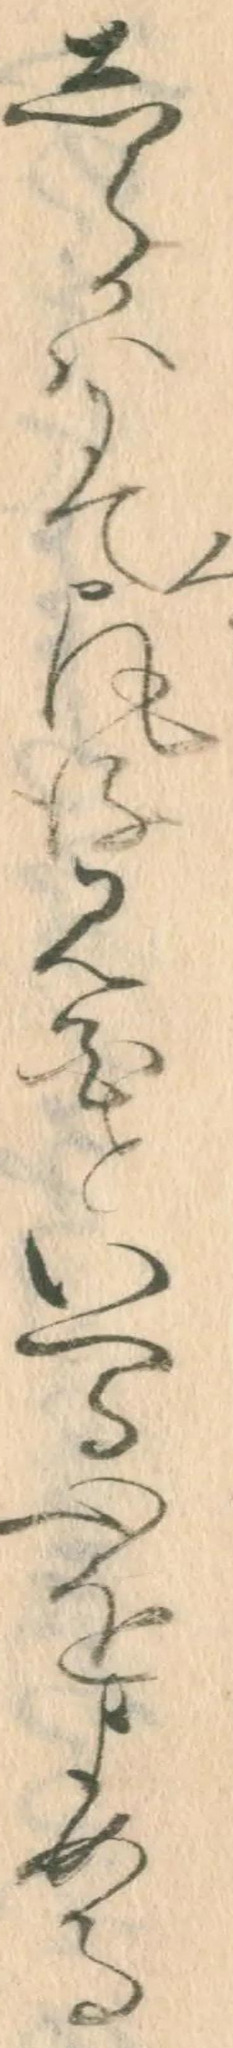しらかはにて◦風後見花といへる心をよめる
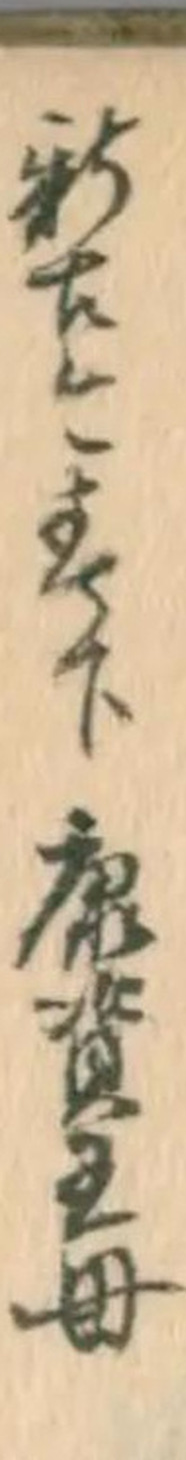新古今春下康資王母
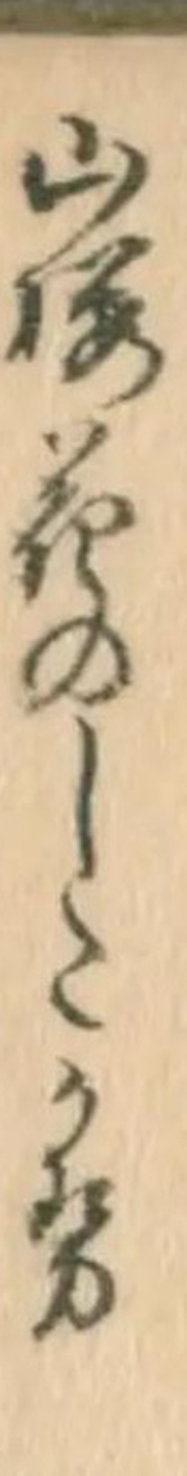山桜花のしたかせ
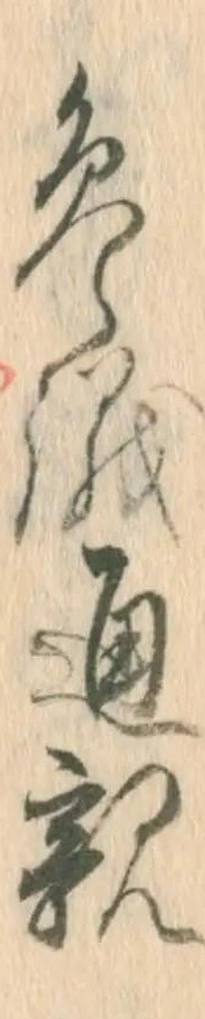参議通親
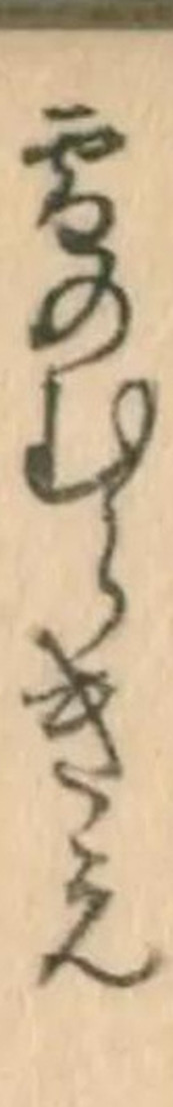雪のむらきえ
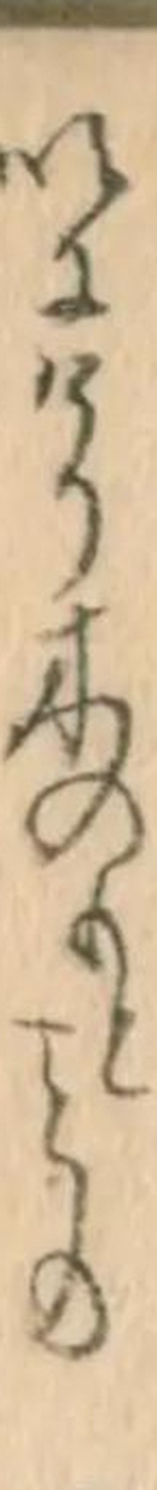吹にけり木のもとことの
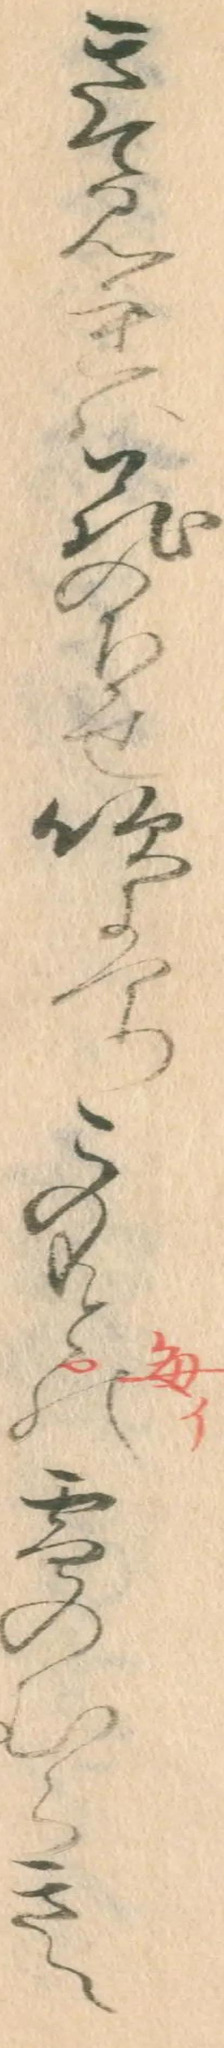きてみれは花の下かせ吹にけりこのもと◦の雪のむらきえ
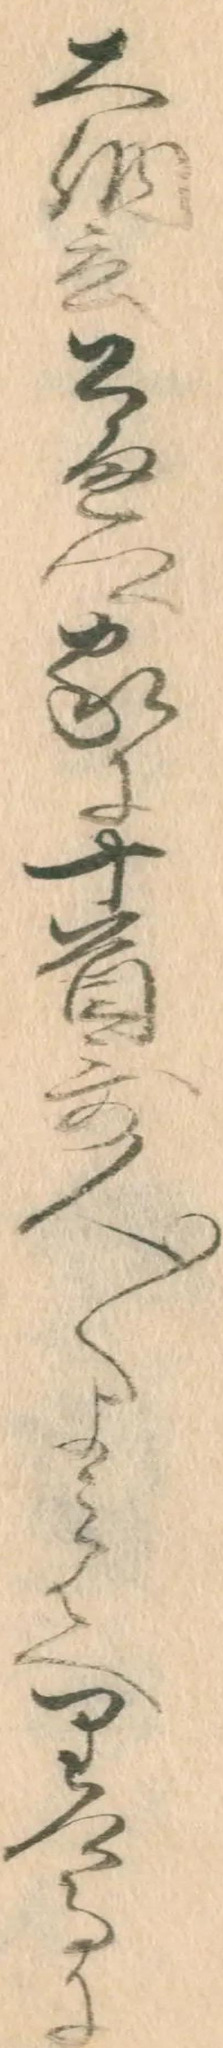大納言公通卿家に十首歌人〳〵よみはへりけるに
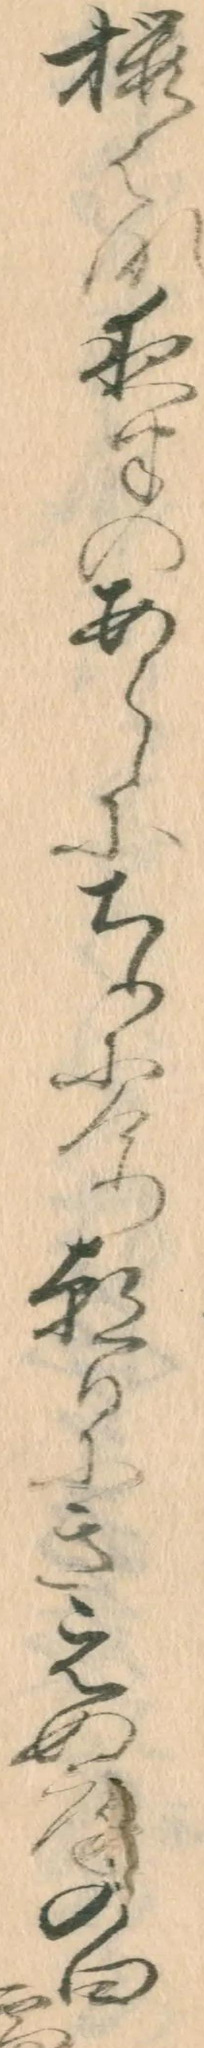桜はな夜半のあらしにちりにけり朝日にきえぬ峯の白雪
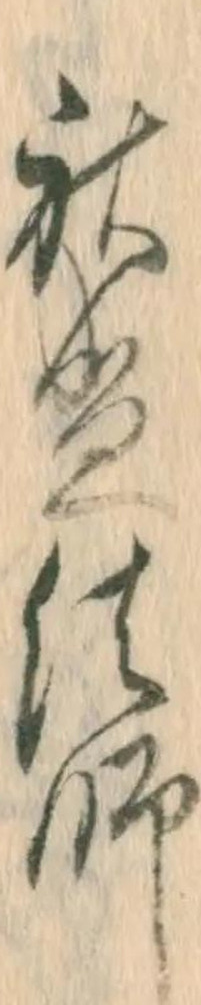裕盛法師
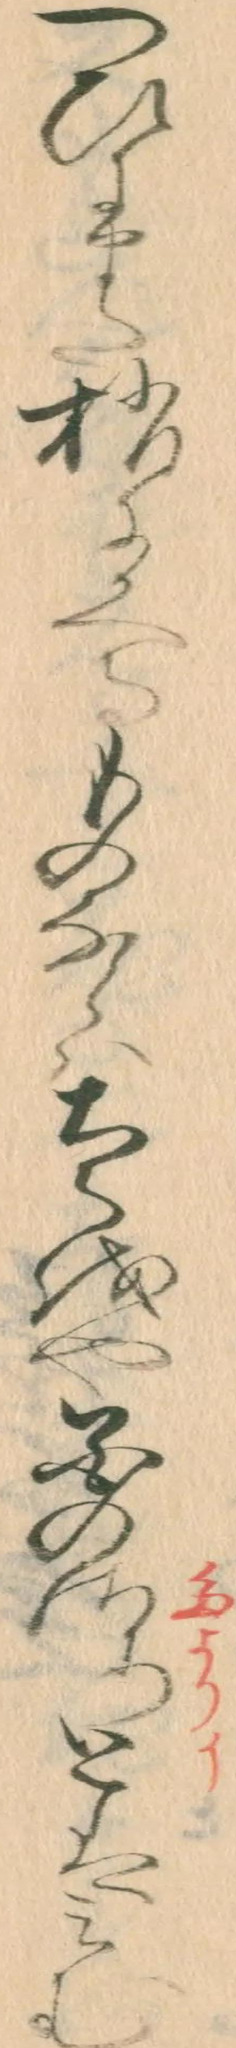つひにまた梢にかへるものならはちるをや花のさかりとはみむ
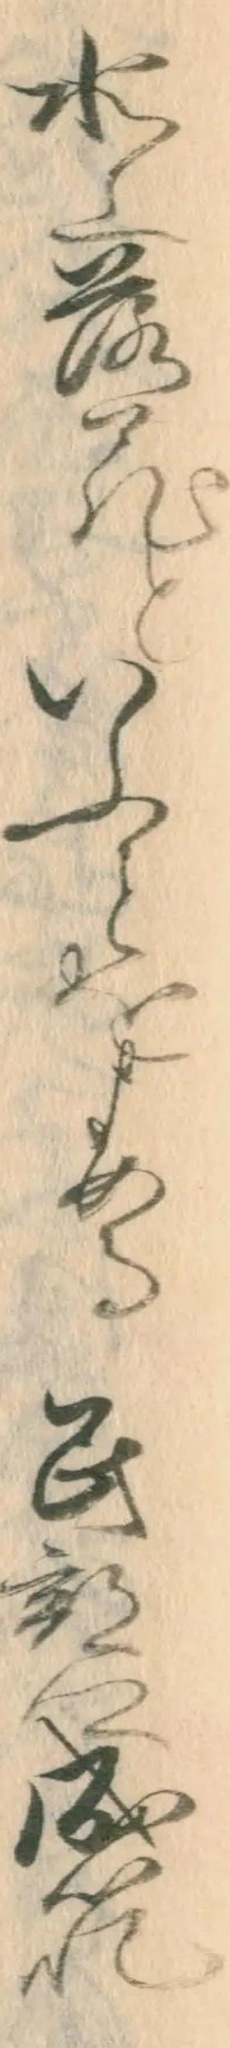水上落花といふことをよめる民部卿成範
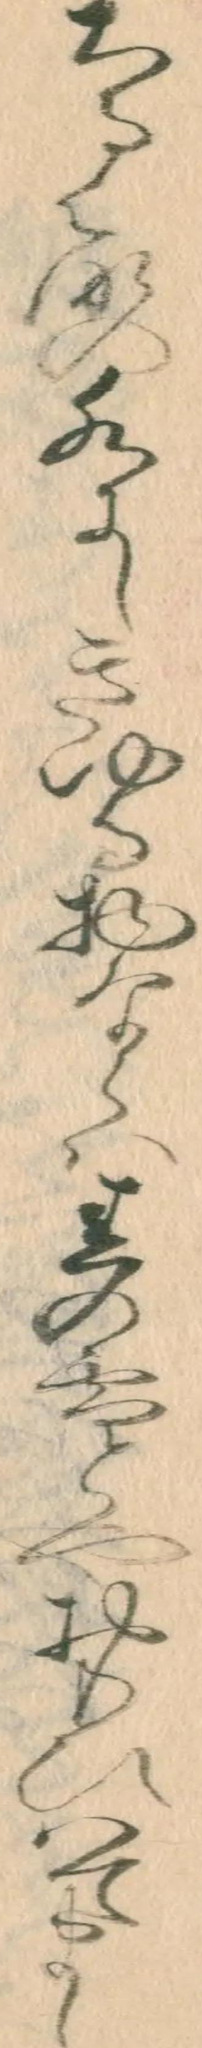ちるはなの水にしきゆる物ならは春の雪とやおもひはてまし
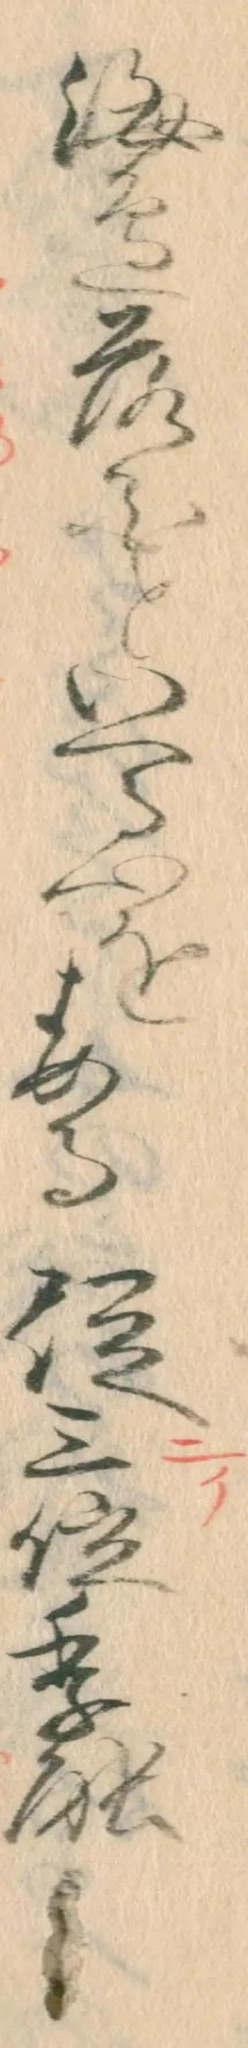海辺落花といへる心をよめる従三位季能
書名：月詣和歌集
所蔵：国立国会図書館 National Diet Library, JAPAN
